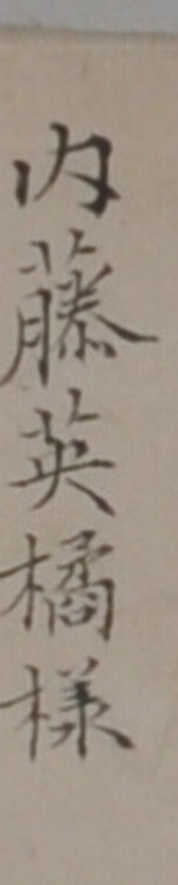内藤英橘様
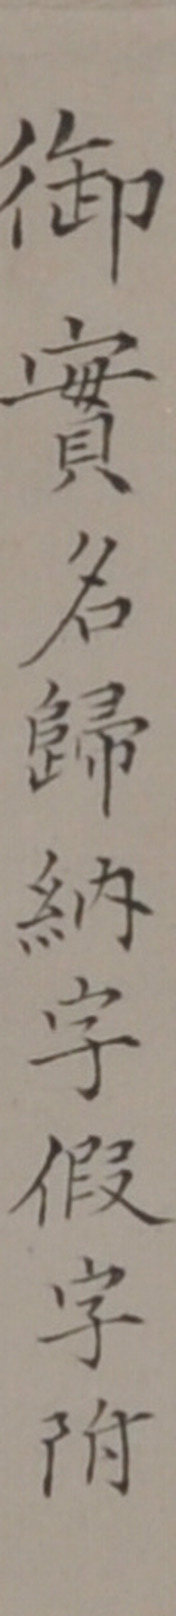御実名帰納字仮字附

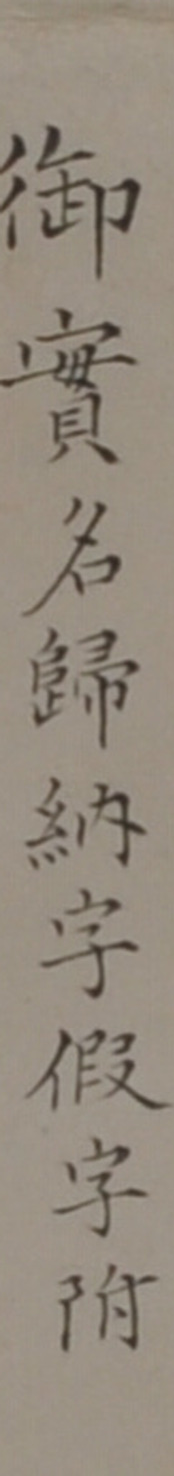御実名帰納字仮字附
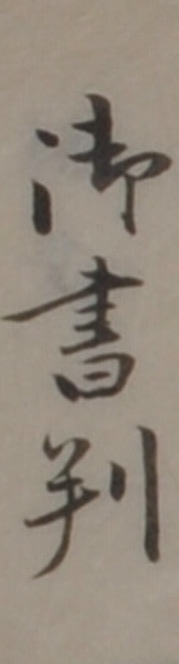御書判

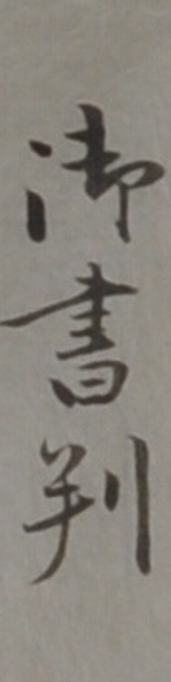御書判

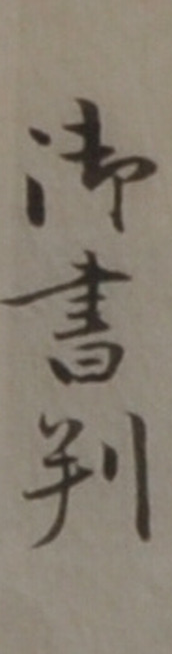御書判

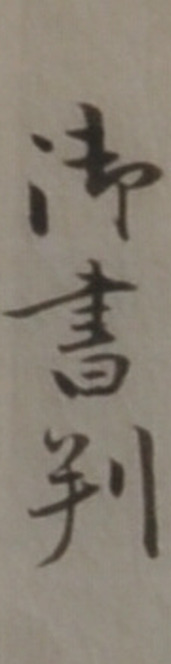御書判
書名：御実名・御書判
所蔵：伊那市立高遠町図書館・合同会社AMANE
